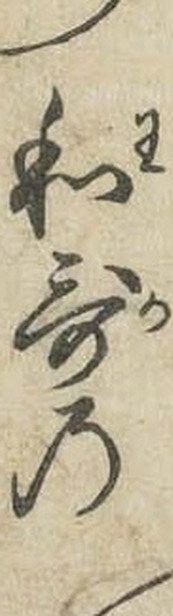和哥の
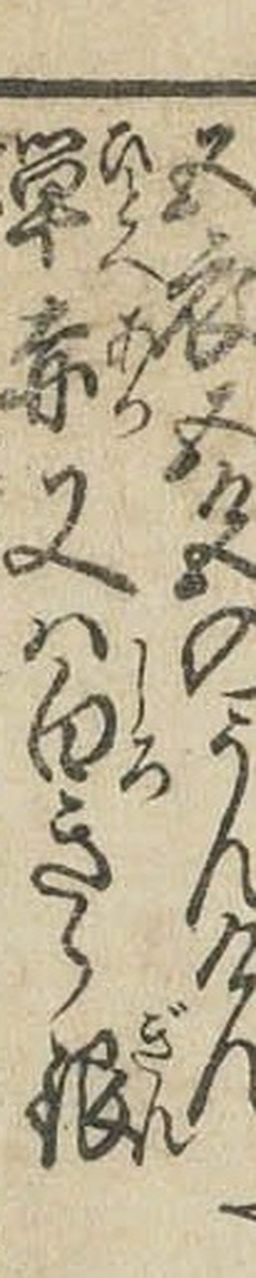単赤又は白きら銀
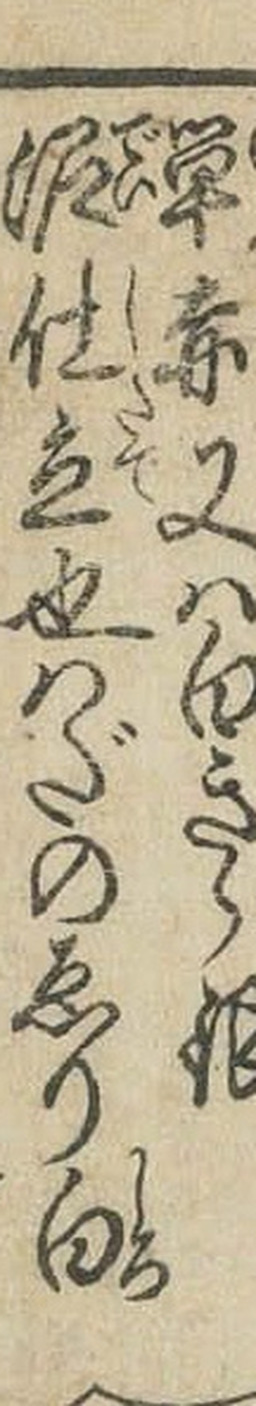泥仕立也はだのゑり白
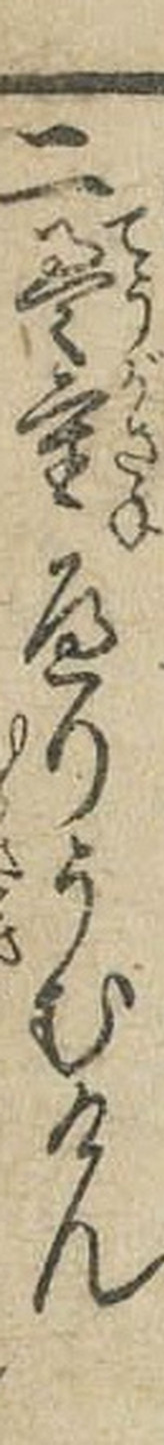二畳重へりうむけん
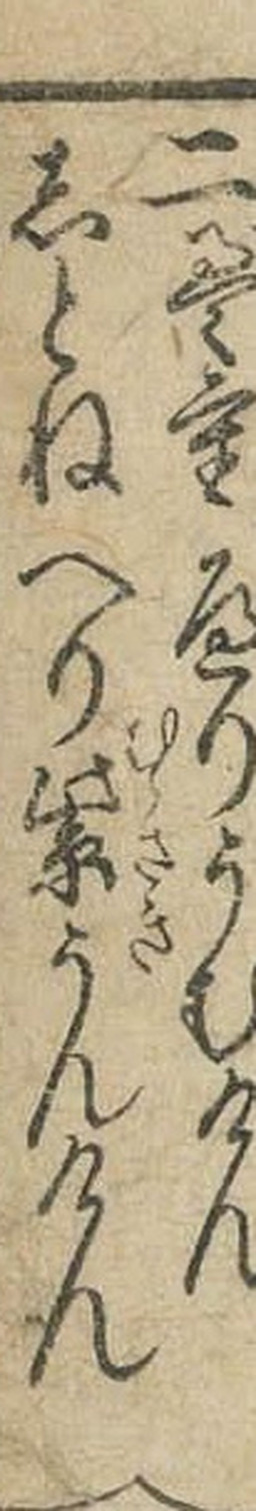しとねへり紫うんけん

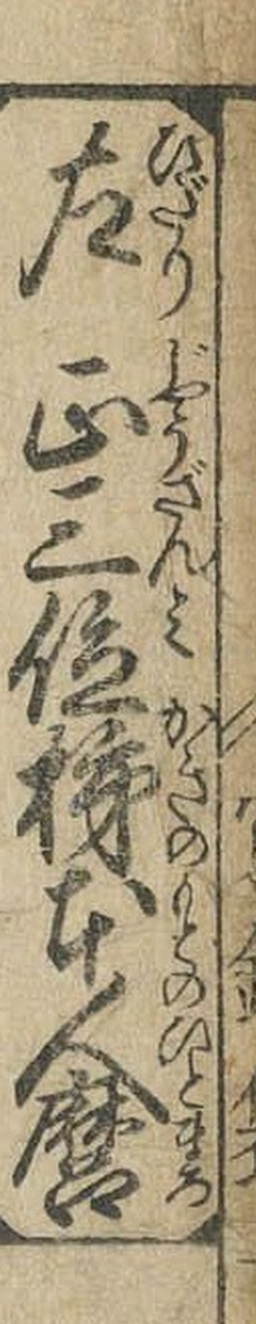左正三位柿本人麿
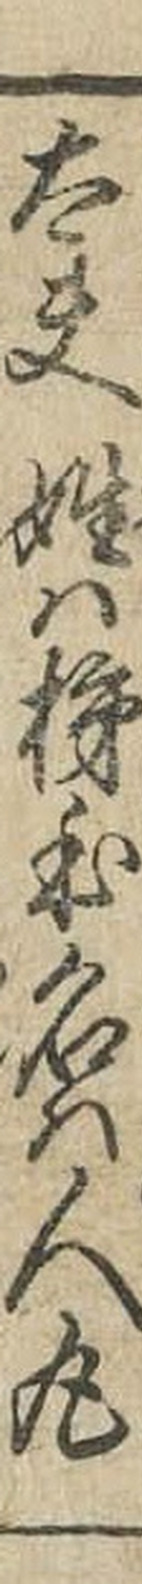太夫姓は柿本名は人丸
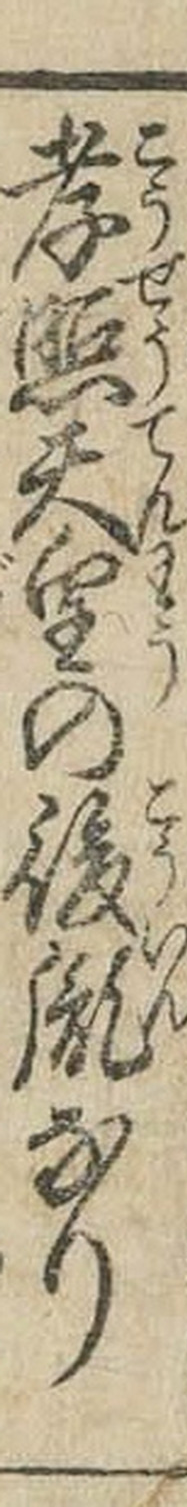孝照天皇の後胤なり
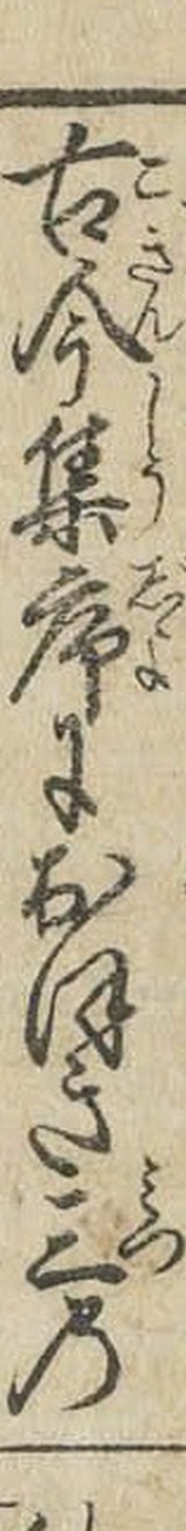古今集序におほき三の
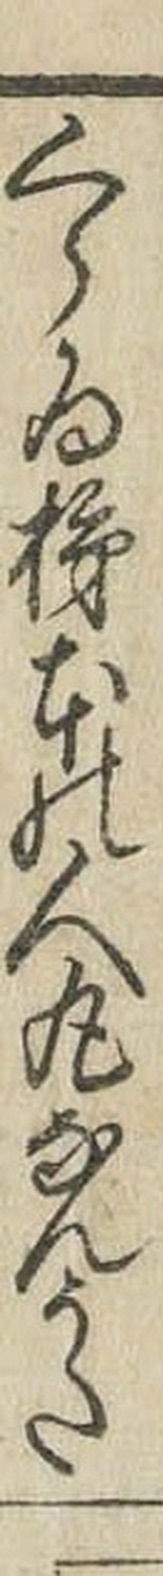くらゐ柿本の人丸なんうた
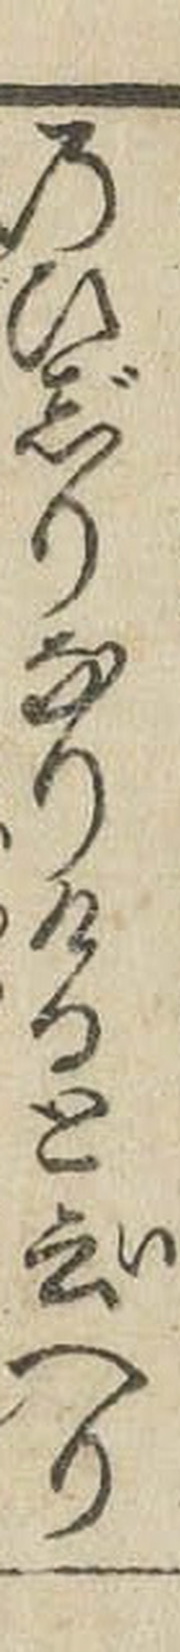のひじりなりけると云へり
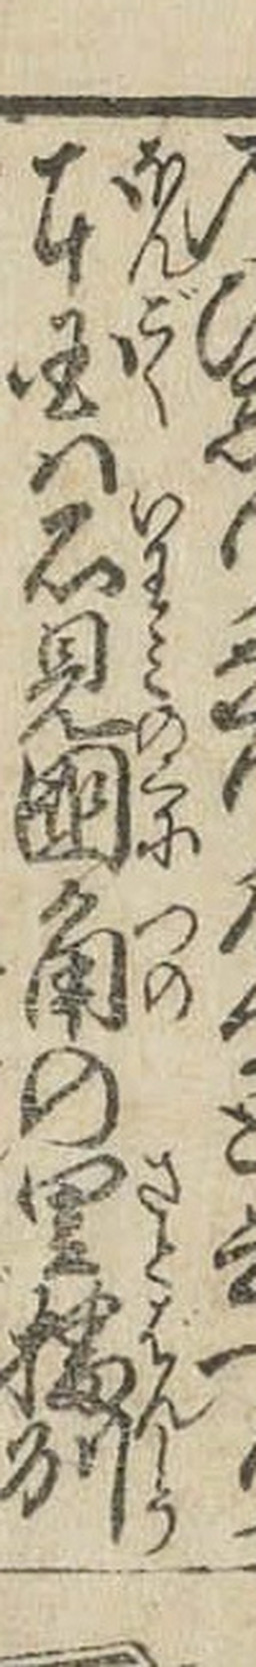本国は石見国角の里播州
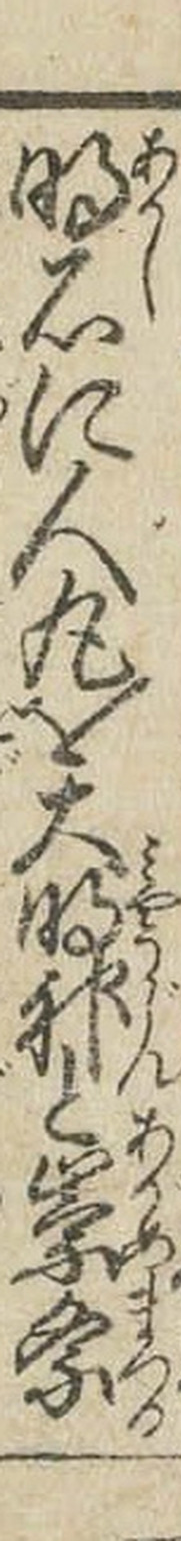明石に人丸を大明神と崇祭
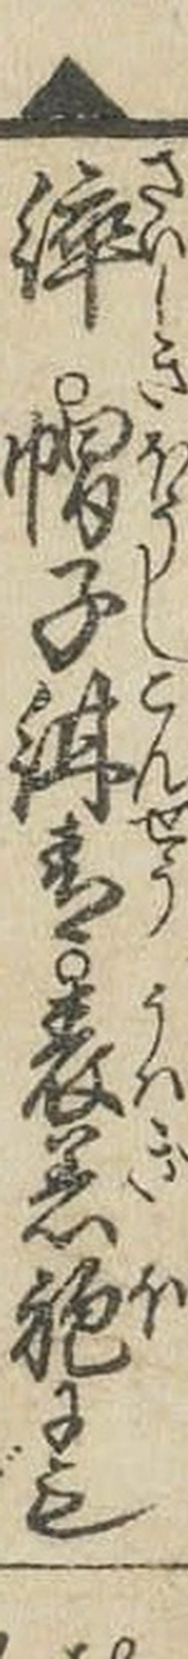○帽子紺青○表着袍にも
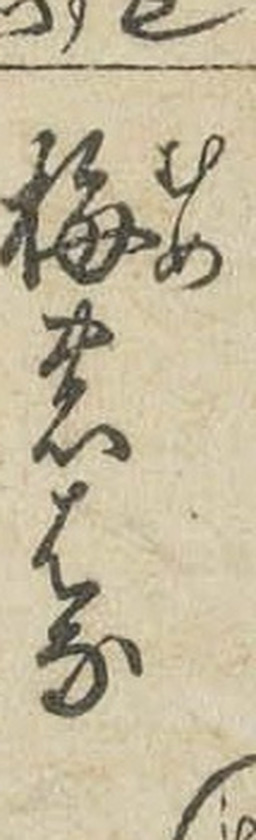梅のはな
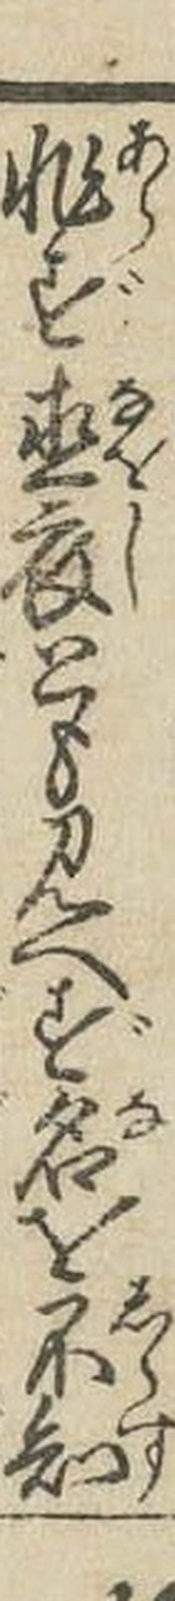非ず直衣とも見へず名を不知
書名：絵本写宝袋 9巻 1之巻
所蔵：東京学芸大学教育コンテンツアーカイブ
